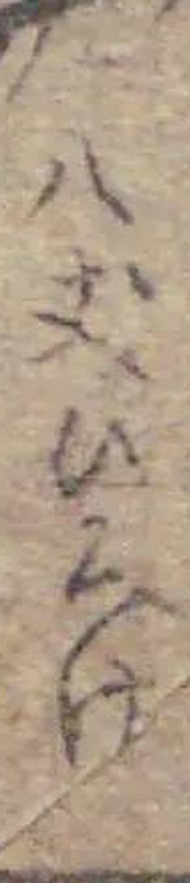八丈ひろけ
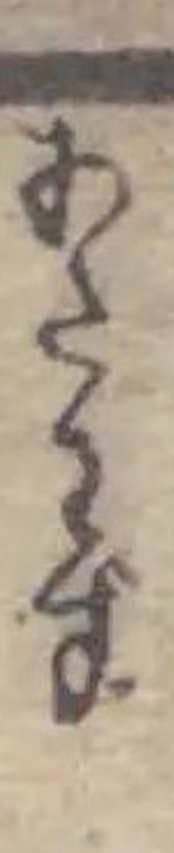あたわず
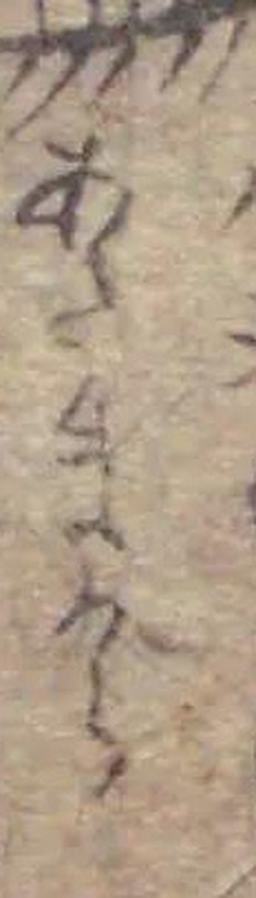あたまから
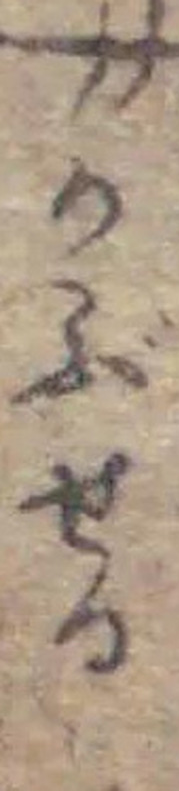かぶせる
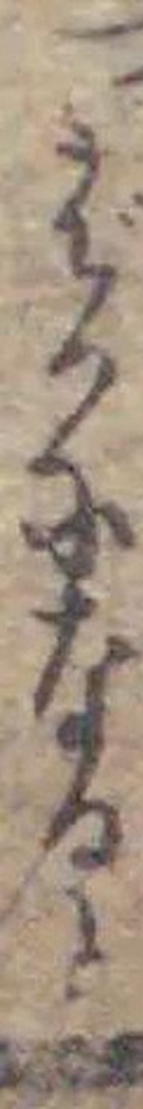ばかになると

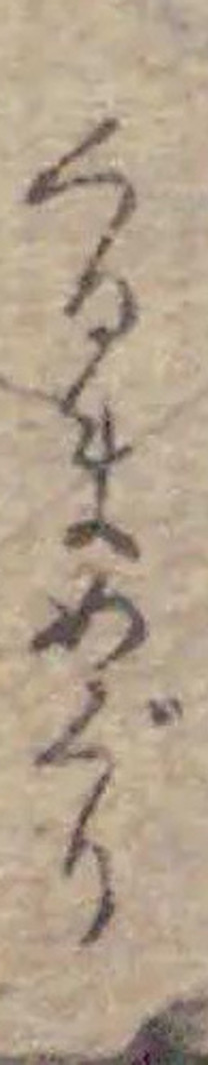くるまめぐり
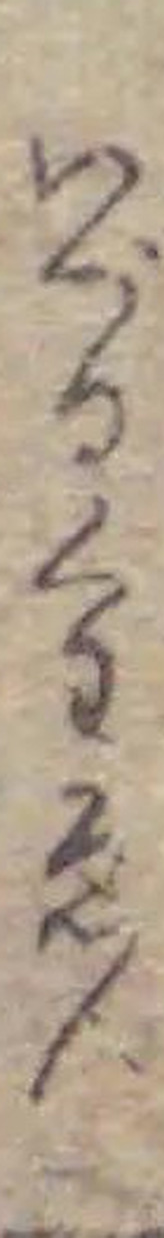いづるくわゑん
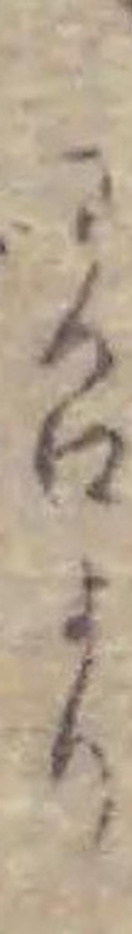わか口より
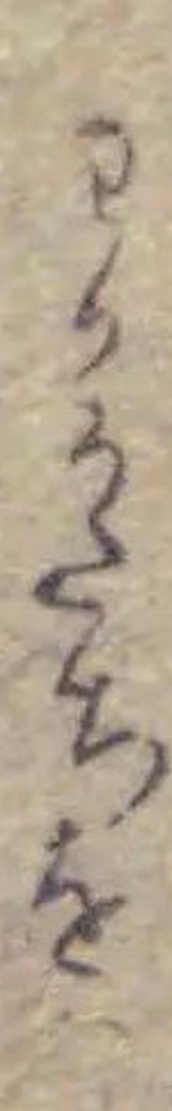わかかたちを
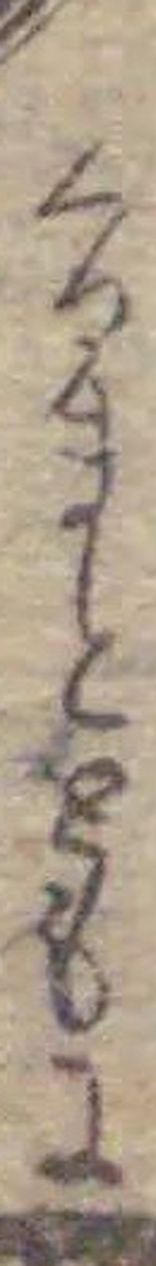くるまとともに
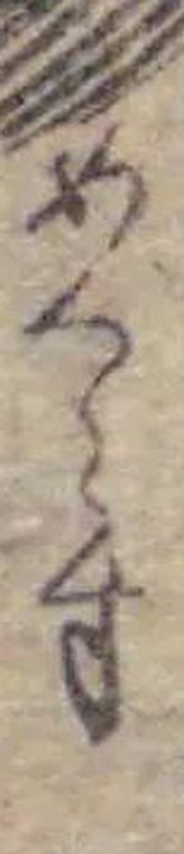めくらす
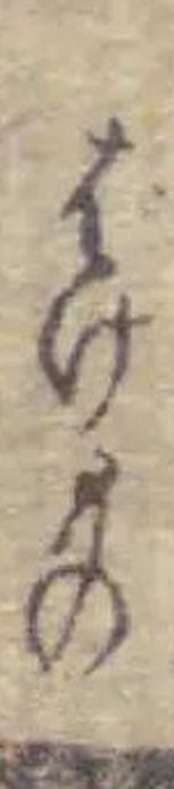ばけもの
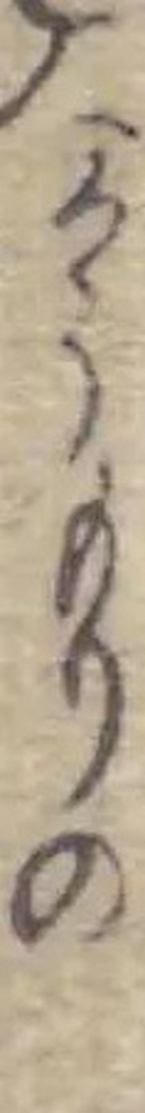かうもりの
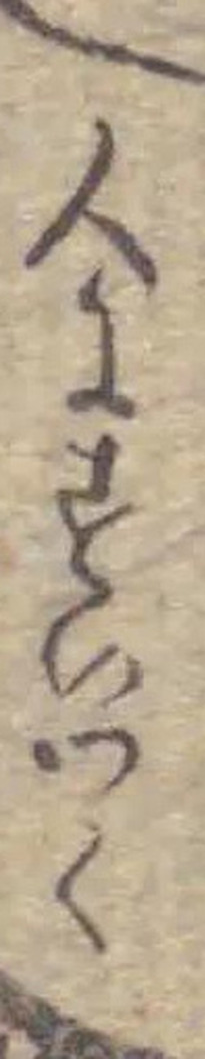人にすいつく
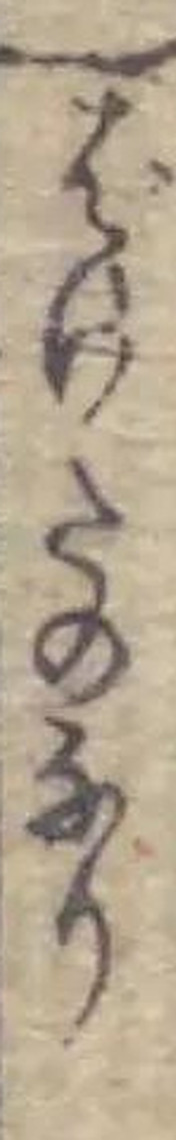ばけたのなり
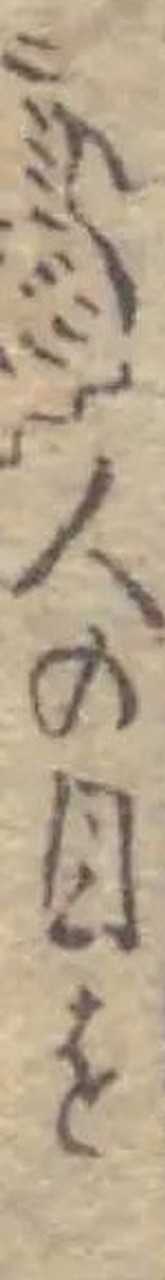人の目を
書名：夭怪着到牒 2巻
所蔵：国立国会図書館 National Diet Library, JAPAN
